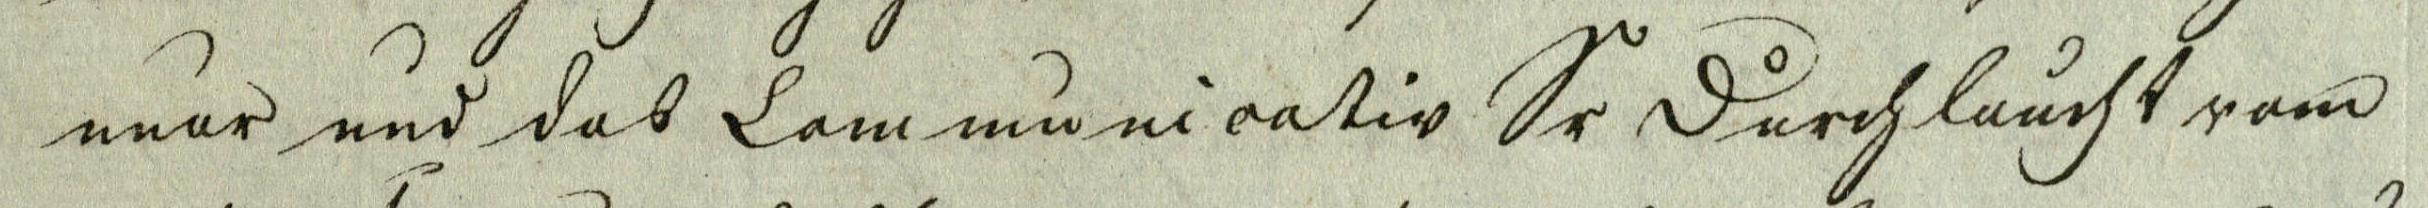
nuar und das Communicativ Sr Durchlaucht vom
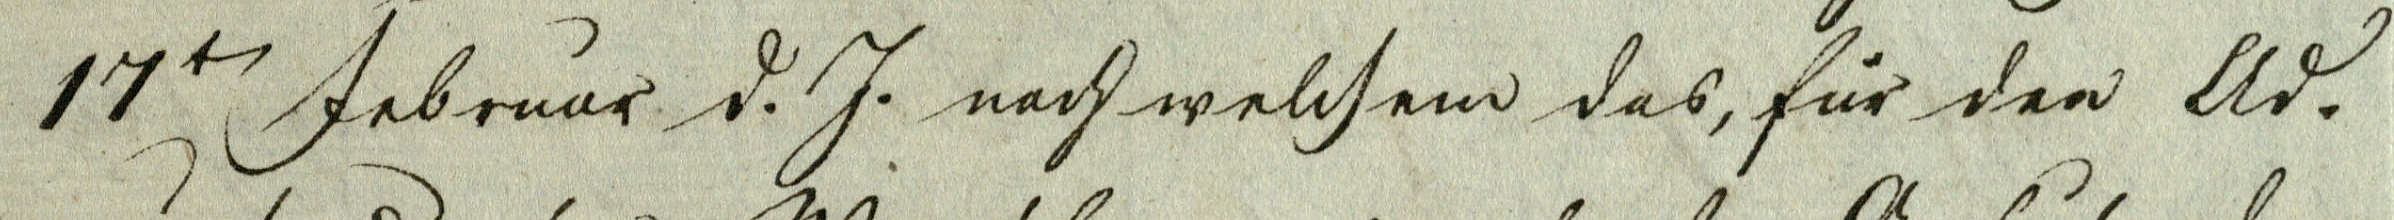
17ten Februar d. J. nach welchem das, für den Ad¬
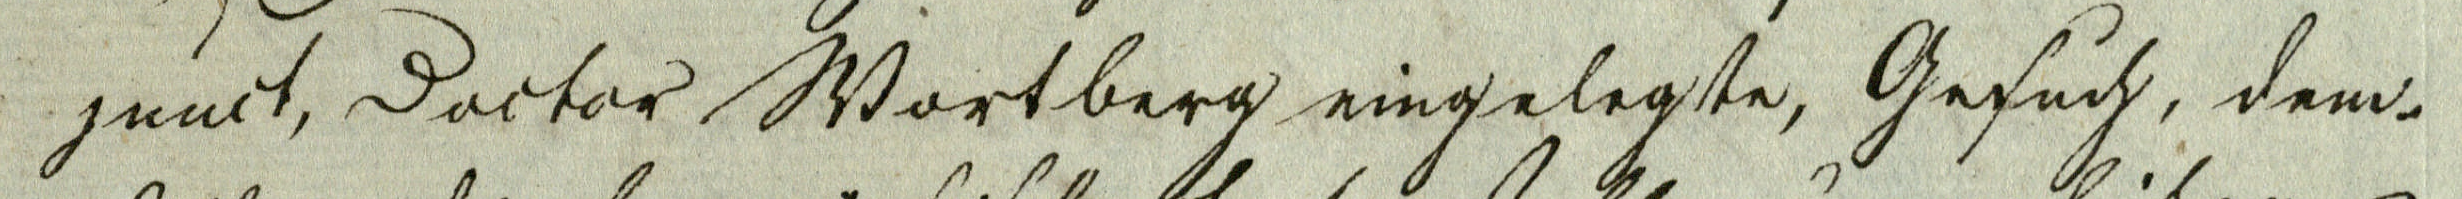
junct, Doctor Wortberg eingelegte, Gesuch, dem¬
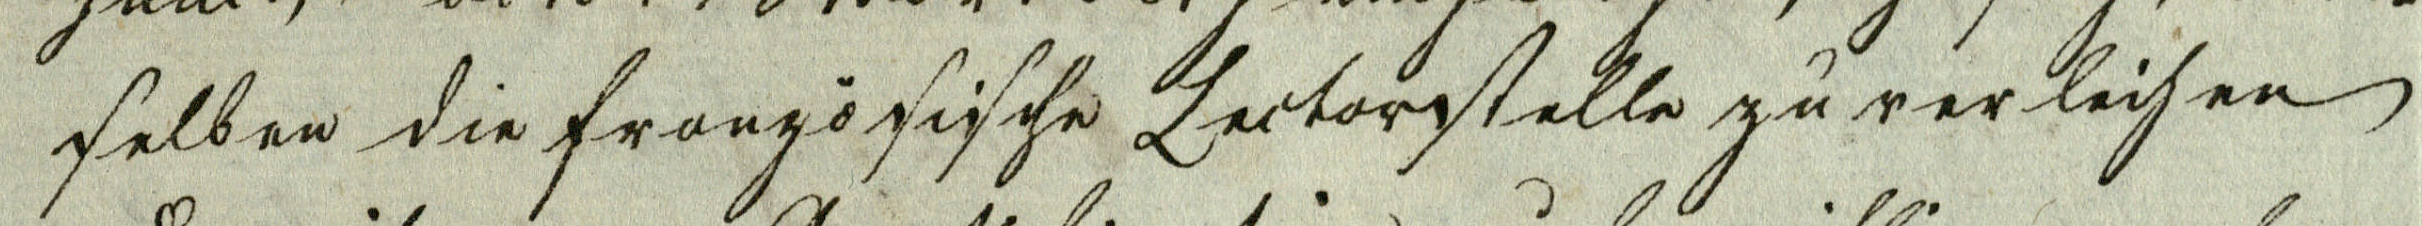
selben die französiche Lectorstelle zu verleihen
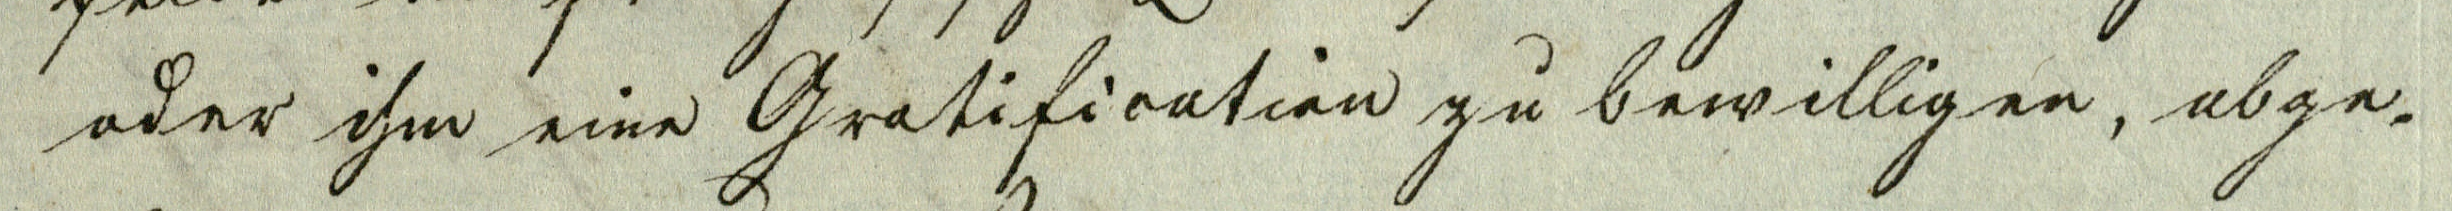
oder ihm eine Gratification zu bewilligen, abge¬
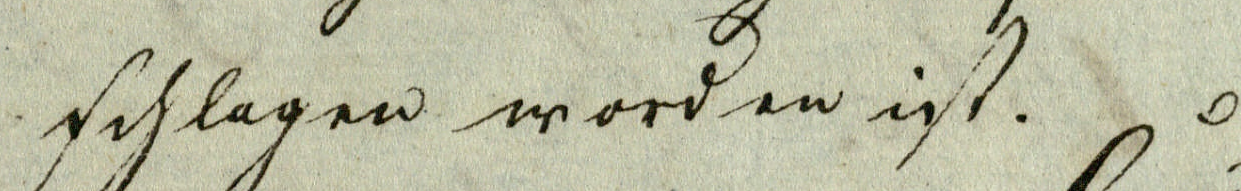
schlagen worden ist.
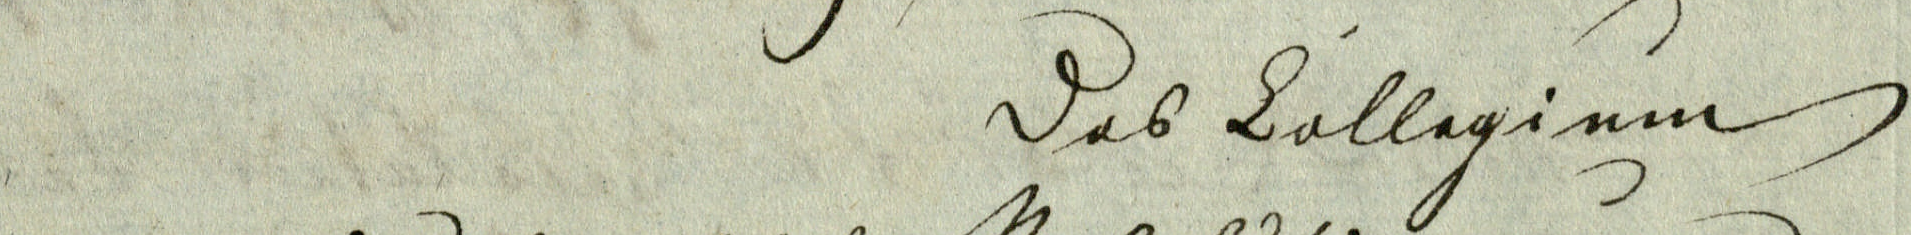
Das Collegium
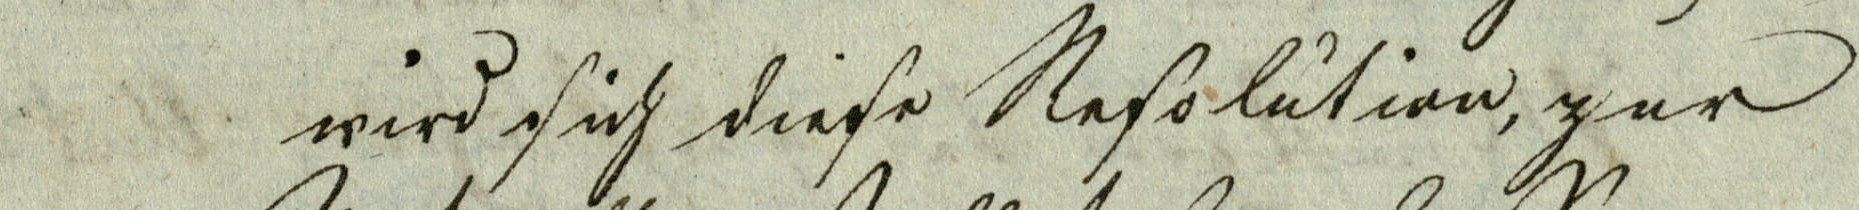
wird sich diese Resolution, zur
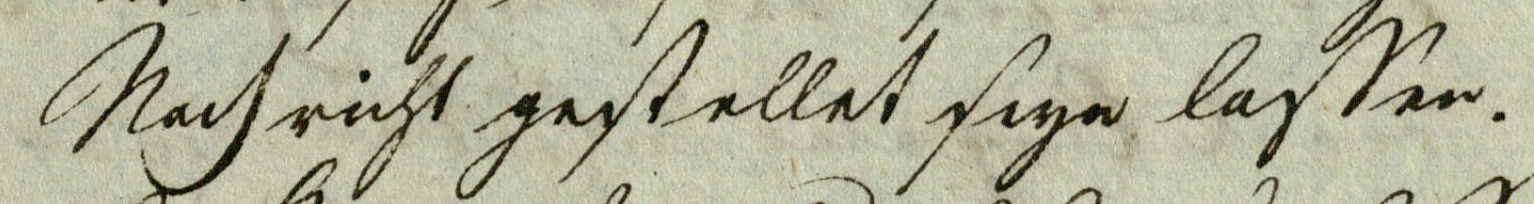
Nachricht gestellet seyn lassen.
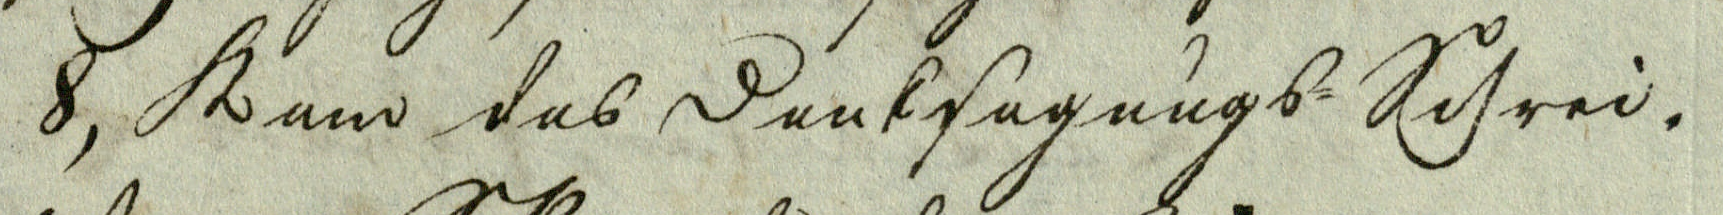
8, Kam das Danksagungs-Schrei¬
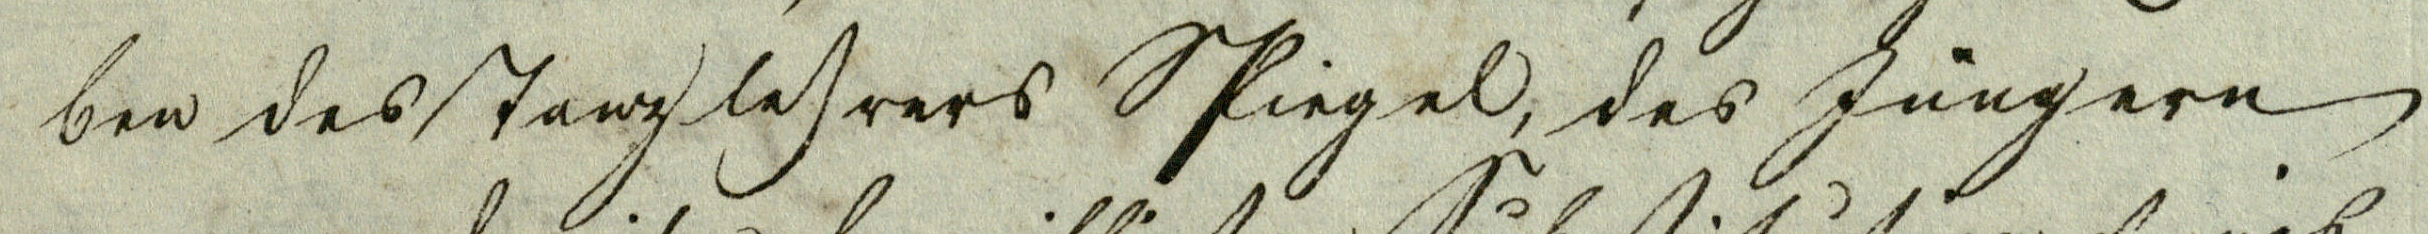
ben des Tanzlehrers Spiegel, des Jüngern
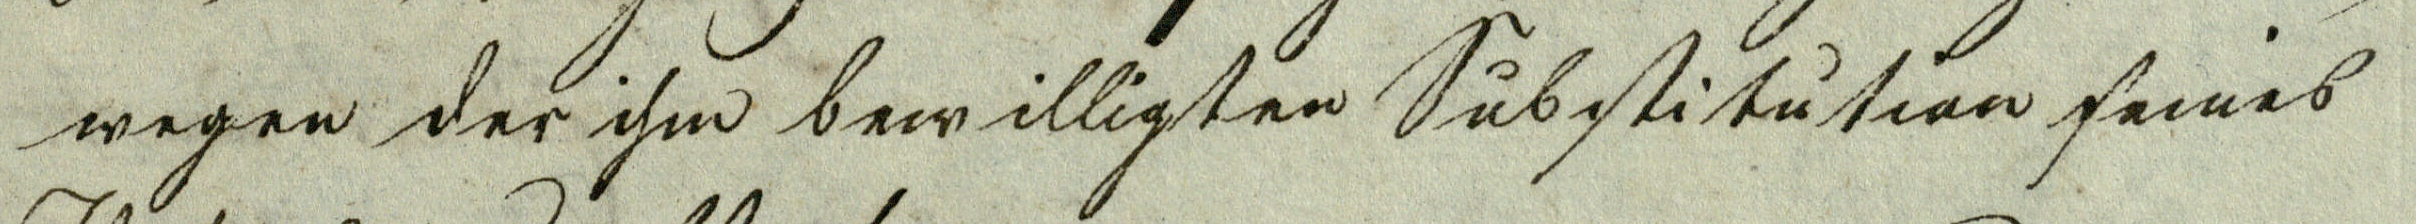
wegen der ihm bewilligten Substitution seines
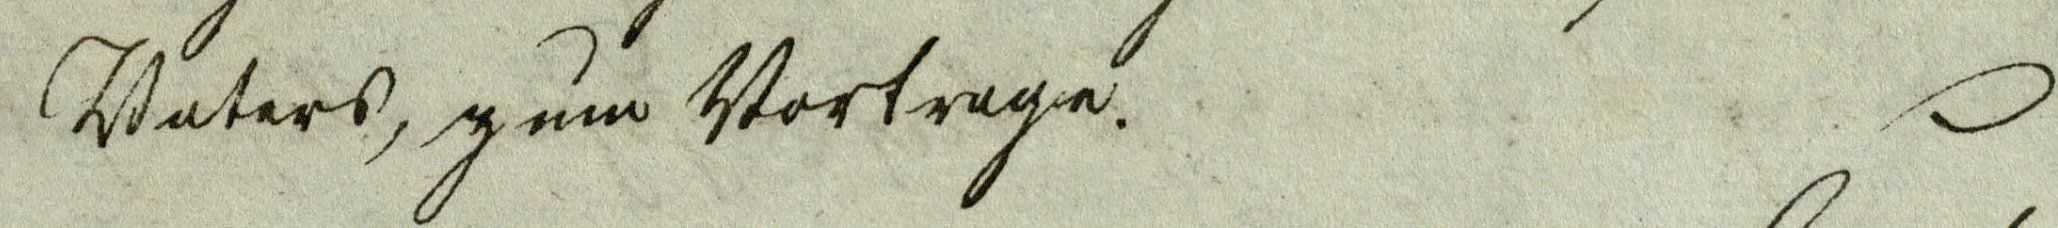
Vaters, zum Vortrage.
